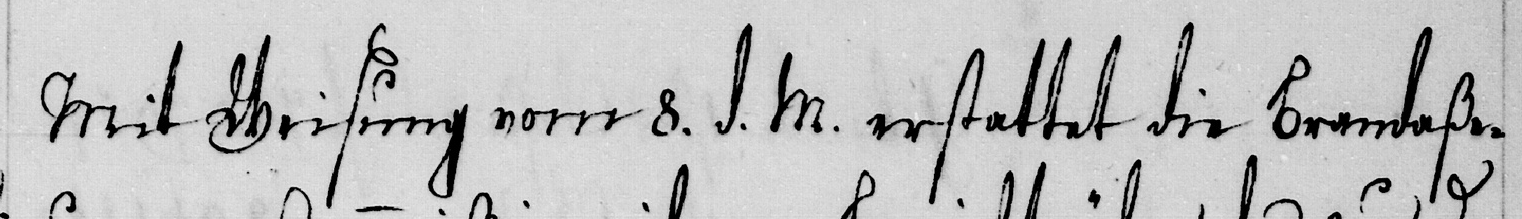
Mit Weisung vom 8. d. M. erstattet die Brandaße¬
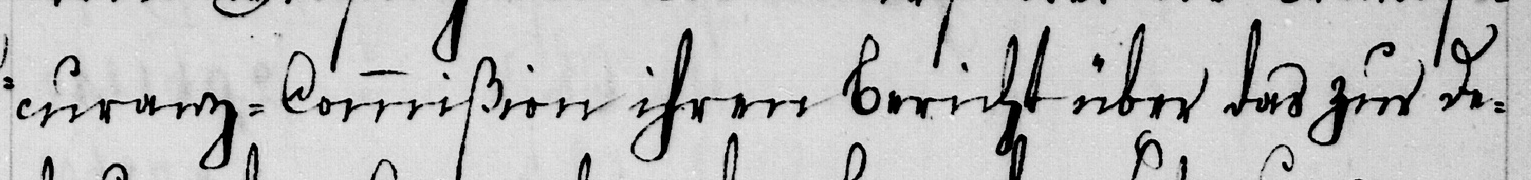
curanz-Commißion ihren Bericht über das zur De¬
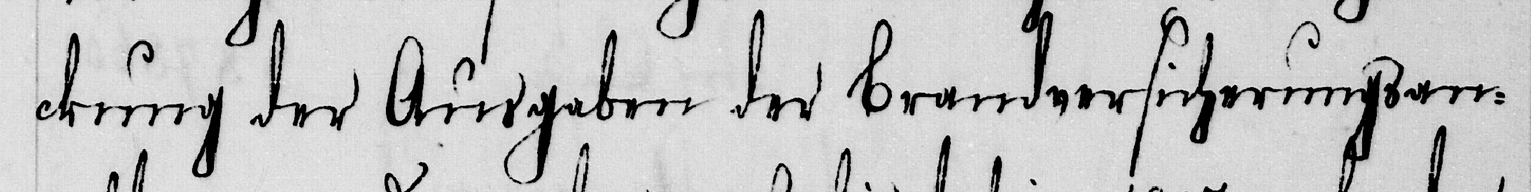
ckung der Ausgaben der Brandversicherungsan¬
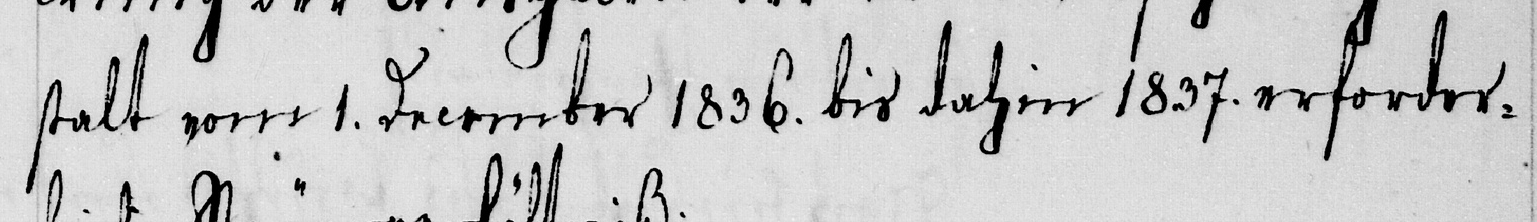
stalt vom 1. December 1836. bis dahin 1837. erforder¬
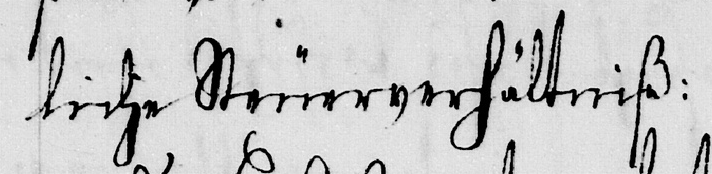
liche Steuerverhältniß:
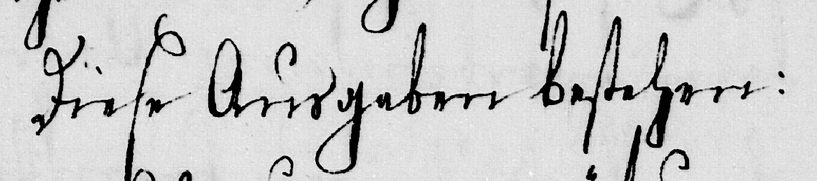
Diese Ausgaben bestehen:
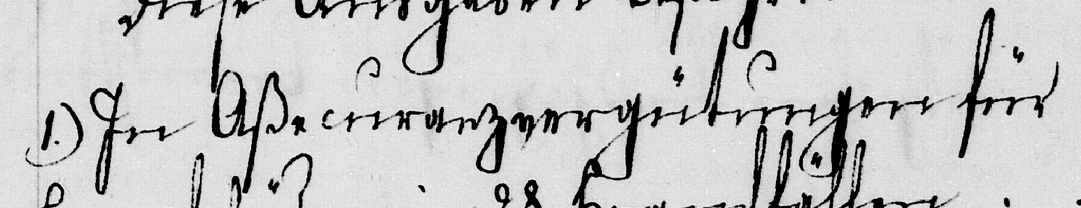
1.) In Aßecuranzvergütungen für
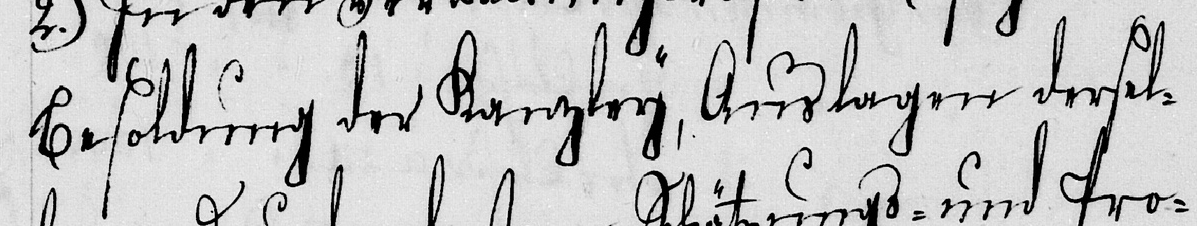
Besoldung der Kanzley, Auslagen dersel¬
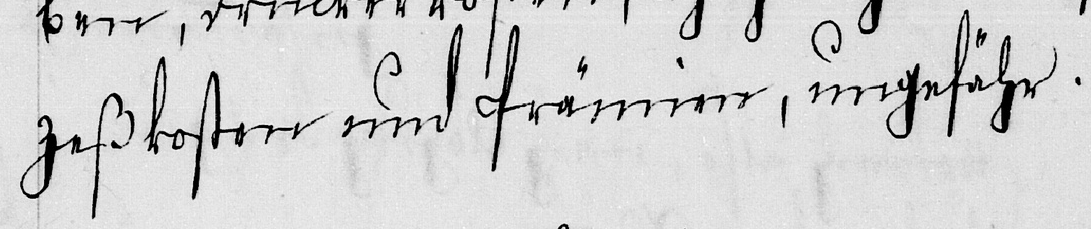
zeßkosten und Prämien, ungefähr
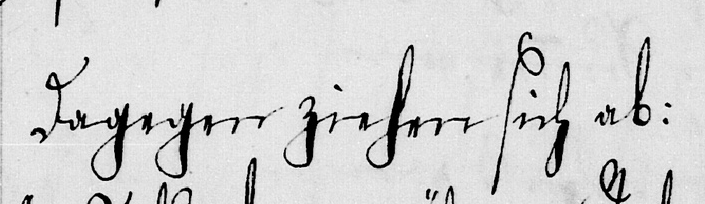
Dagegen ziehen sich ab:
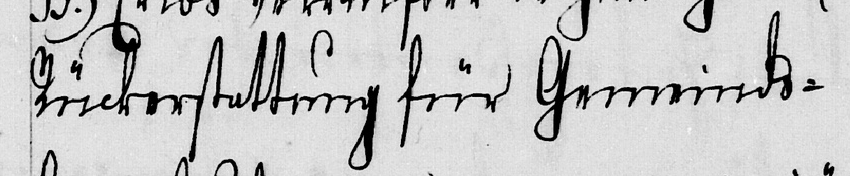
Rückerstattung für Gemeinds¬
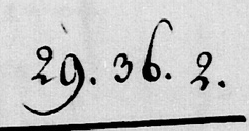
29. 36. 2
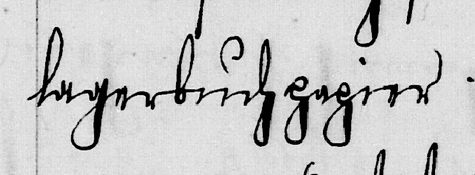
lagerbuchpapier
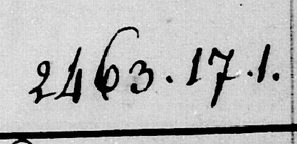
2463. 17. 1.
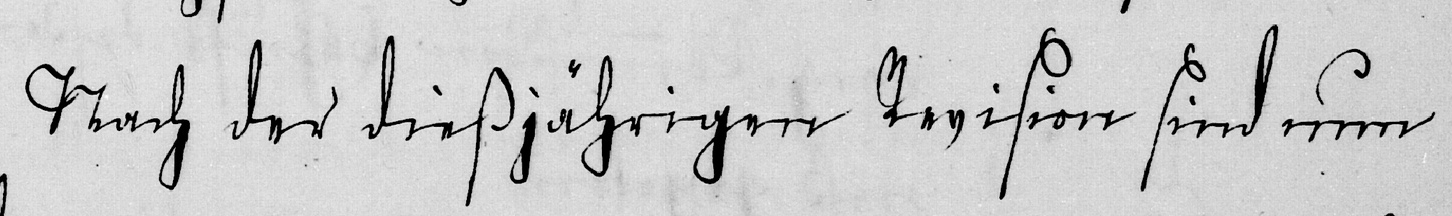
Nach der dießjährigen Revision sind nun
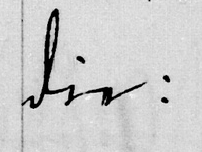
die:
